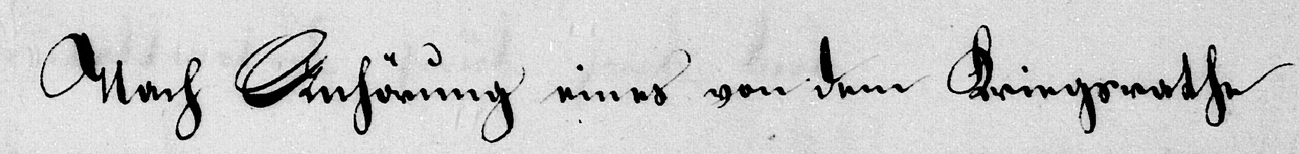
Nach Anhörung eines von dem Kriegsrathe
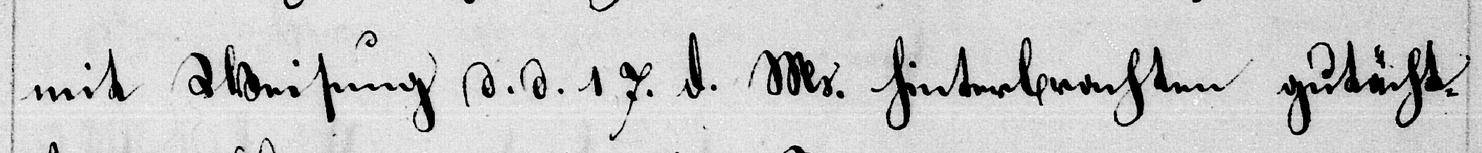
mit Weisung d. d. 17. d. Ms. hinterbrachten gutächt¬
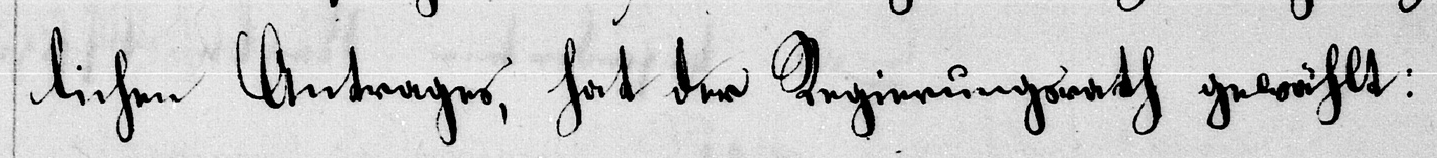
lichen Antrages, hat der Regierungsrath gewählt:
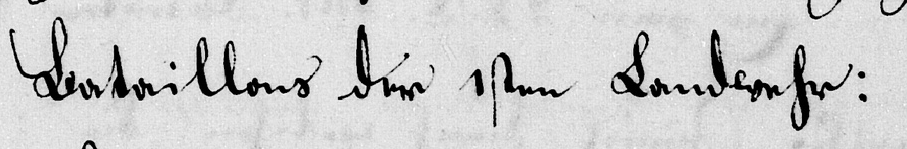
ataillons der 1sten Landwehr:
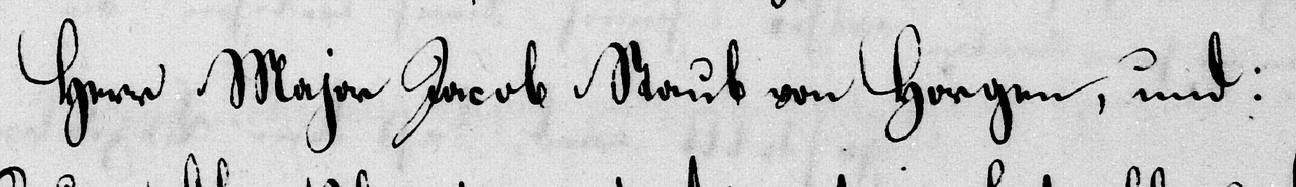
Herr Major Jacob Staub von Horgen, und:
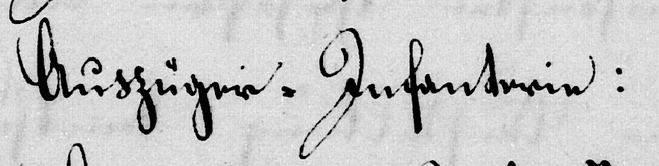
Auszüger-Infanterie:
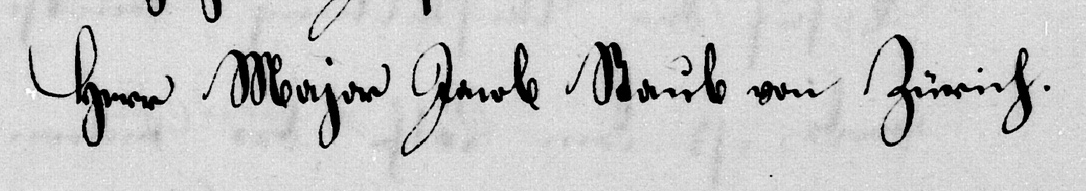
Herr Major Jacob Staub von Zürich.
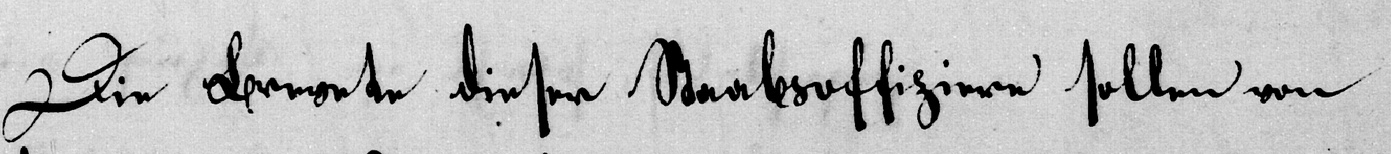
Die Brevete dieser Staabsoffiziere sollen von
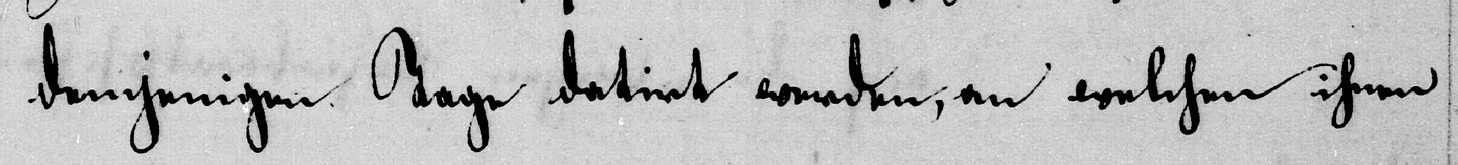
demjenigen Tage datirt werden, an welchen ihnen
